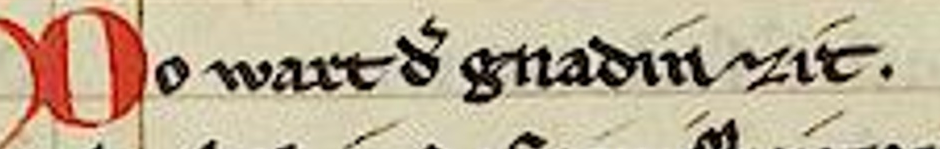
*Do wart d(er) gnadin zit.
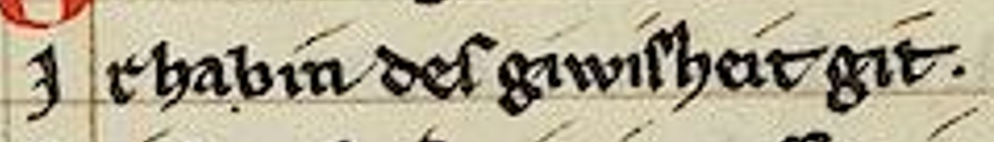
Irhabin deſ giwiſheit git.
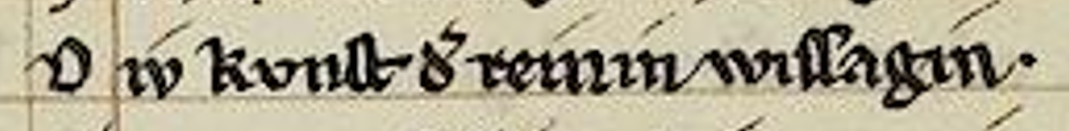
Div kvnſt d(er) reinin wiſſagin.
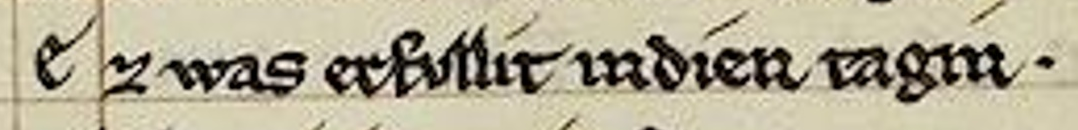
Ez was erfvllit indien tagin.
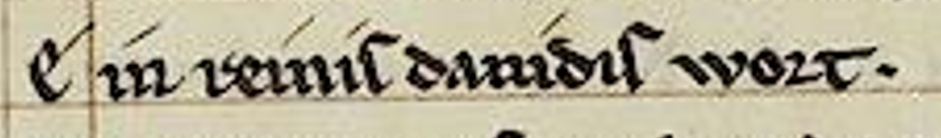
Ein reiniſ dauidiſ wort.
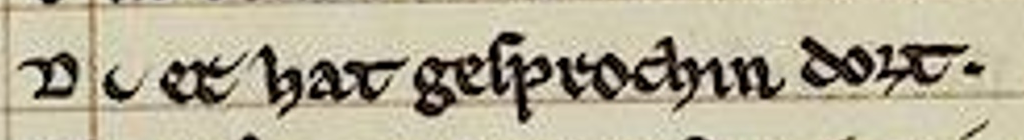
D(az) er hat geſprochin dort.
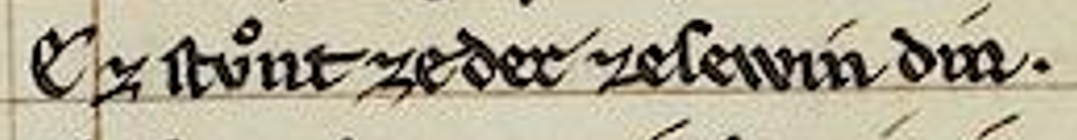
Ez ſtv°ont ze der zeſewin din.
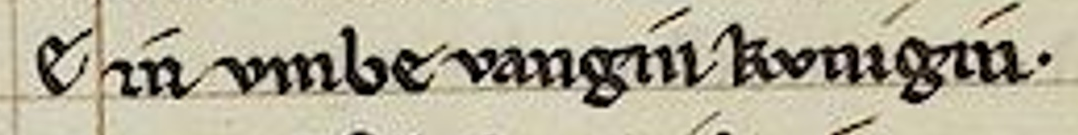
Ein vmbe vangin kvnigin.
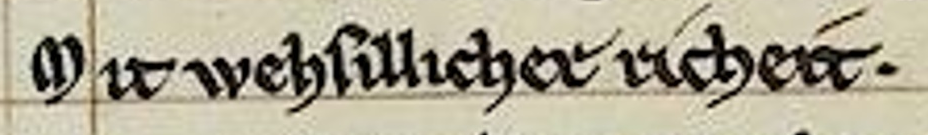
Mit wehſillicher richeit.
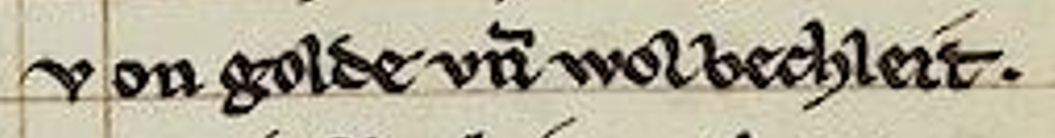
Von golde vn(d) wol bechleit.
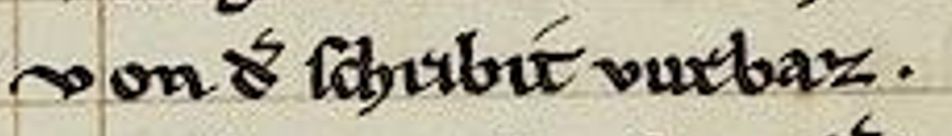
Von d(er) ſchribit vurbaz.
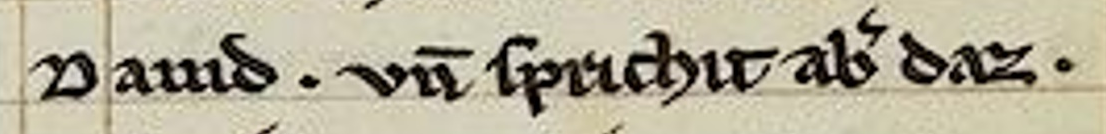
Dauid. vn(d) ſprichit ab(er) daz.
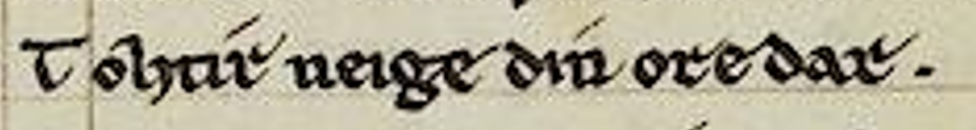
Tohtir neige din ore dar.
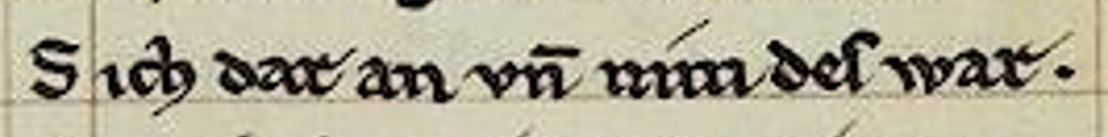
Sich dar an vn(d) nim deſ war.
